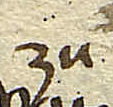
ʒu
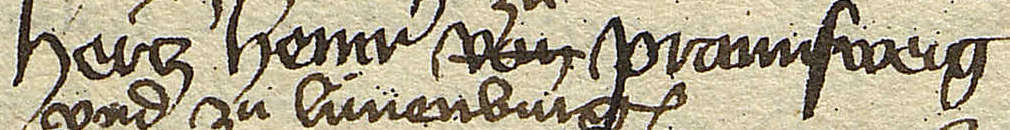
hercʒ* heinr* von Praunſweig
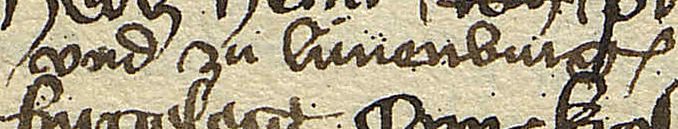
vnd cʒu lünenburg*
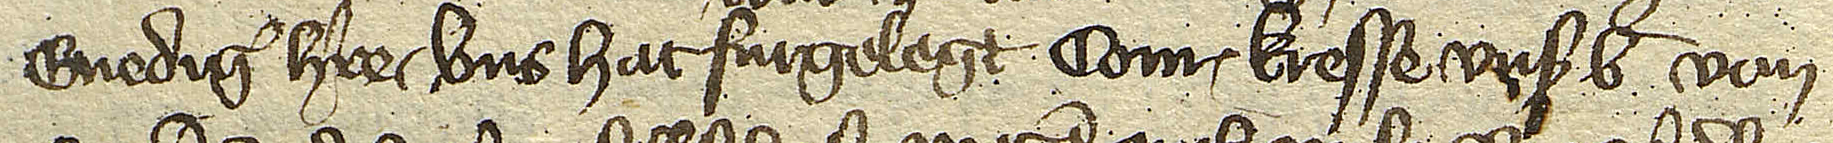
Gnedig* h*re / Vns hat furgelegt Conr* kreſſe vnſ* b* von
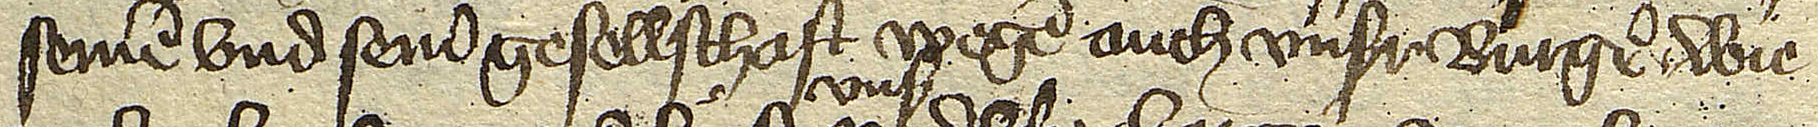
ſeine* vnd ſein* geſellſchaft wege* auch vnſ*r Burge* / wie
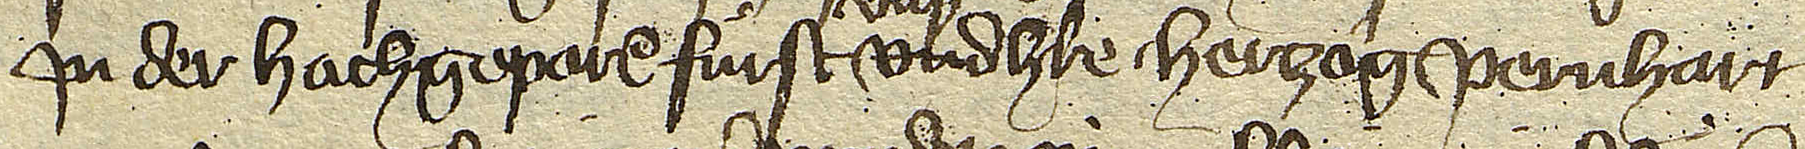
In der hochgepore* fürſt vnd h*re hercʒog pernhart
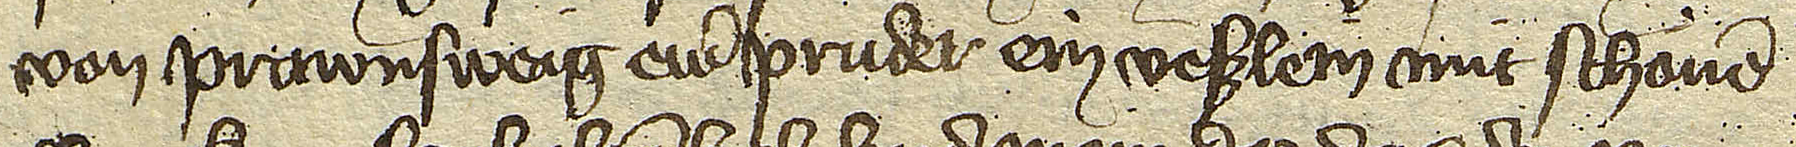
von prawnſweig ew* pruder ein veſʒlein mit ſchöne*
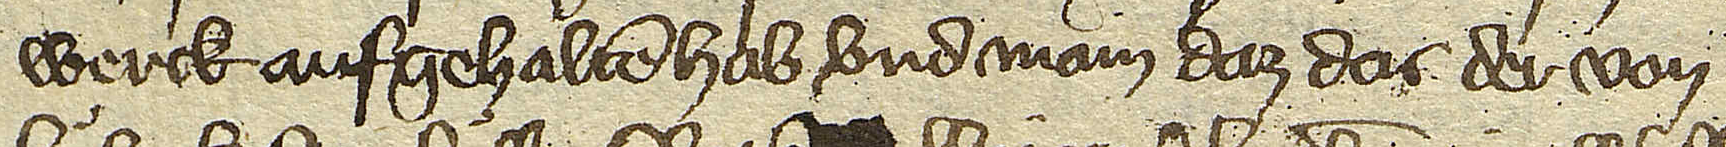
werck aufgehalte* hab vnd main daʒ das der von
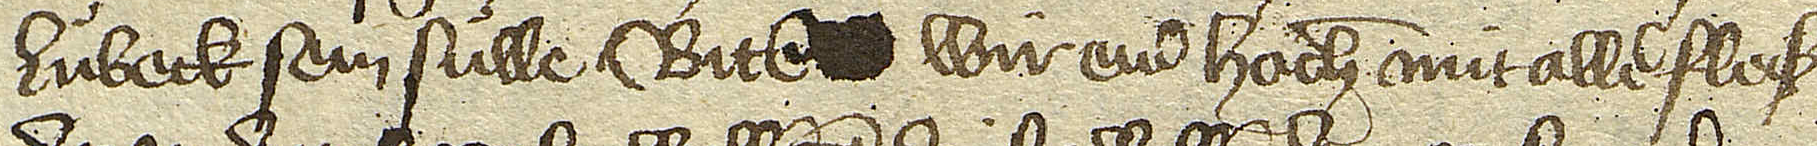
Lübeck ſein ſülle / Bite* wir ew* hoch* mit alle* fleiſʒ
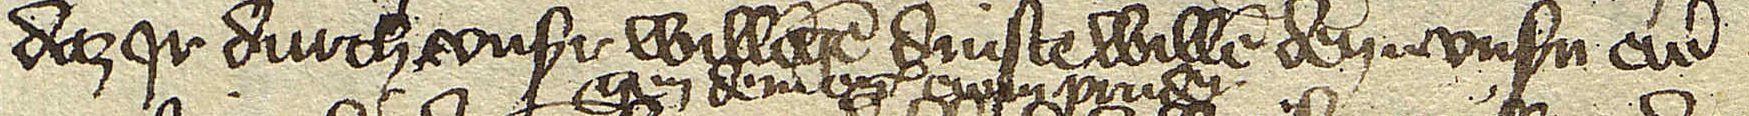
daʒ Ir durch vnſ*r willige* dinſte wille* den ~ vnſ*n ew*
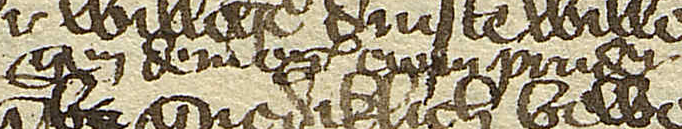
gen dem eg* ewm* pruder
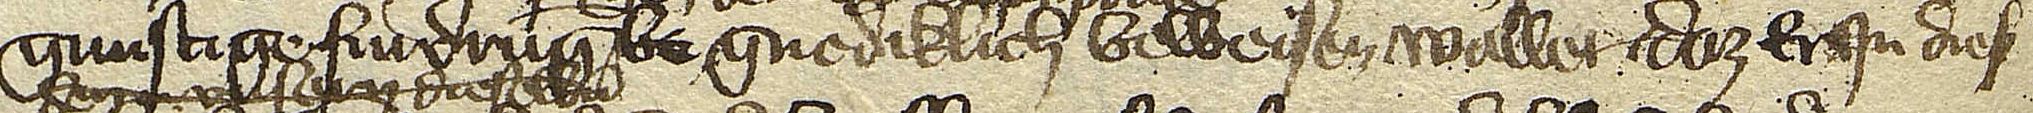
gunſtige fürdrug* vo gnediklich beweiſen wöllet / daʒ Er In dieſ*
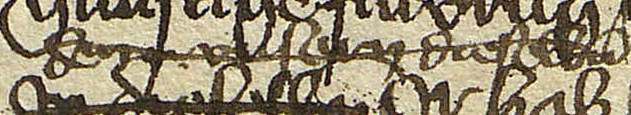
den vnſern dieſelbn*
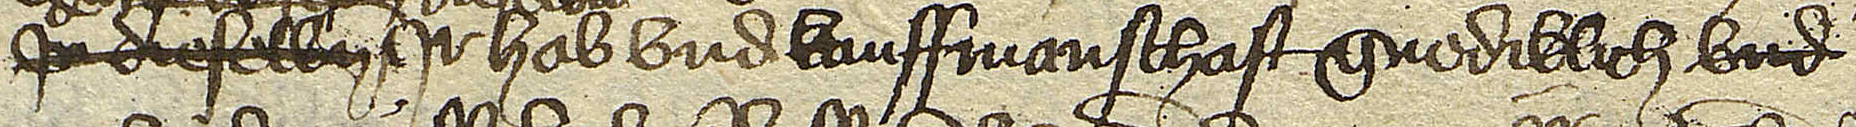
In dieſelbn* Ir hab vnd kauffmanſchaft gnediklich vnd
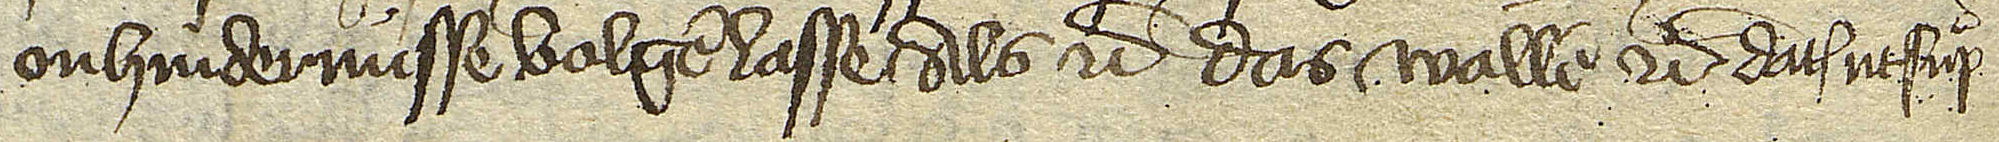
onhindernüſſe volge* laſſe / Als ec* das wölle* ec* dat* ut ſup*
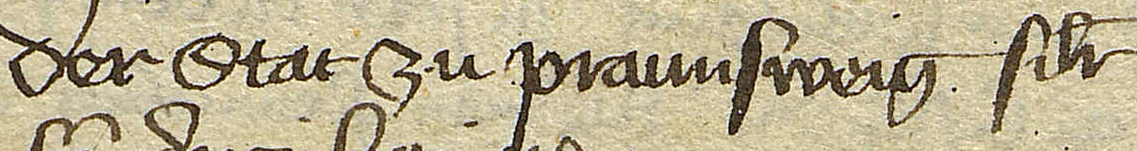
Der Stat cʒu praunſweig ſilr*
